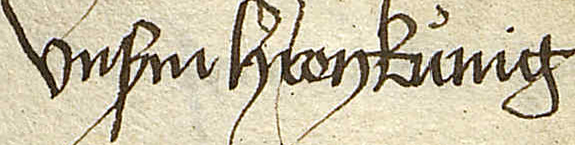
Vnſ*m H*ren Künig
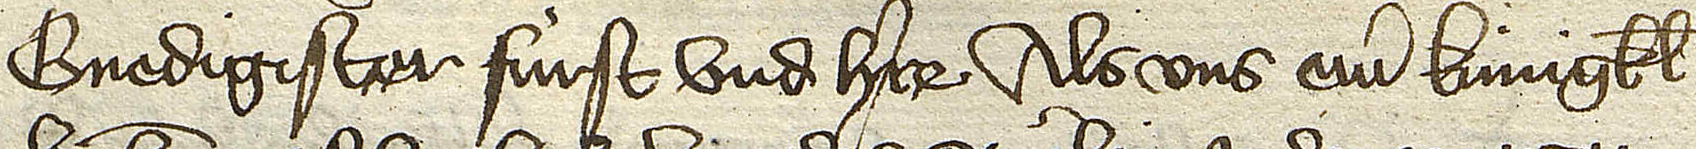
Gnedigiſter fürſt vnd h*re . Als vns ew* künigkl*
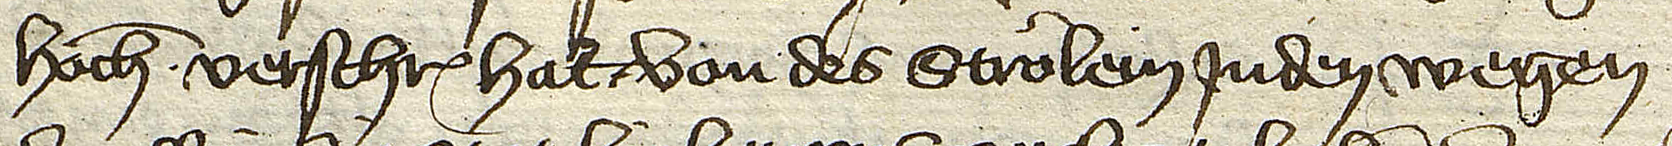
hoch* . verſchr* hat / von des Strölein Iuden wegen
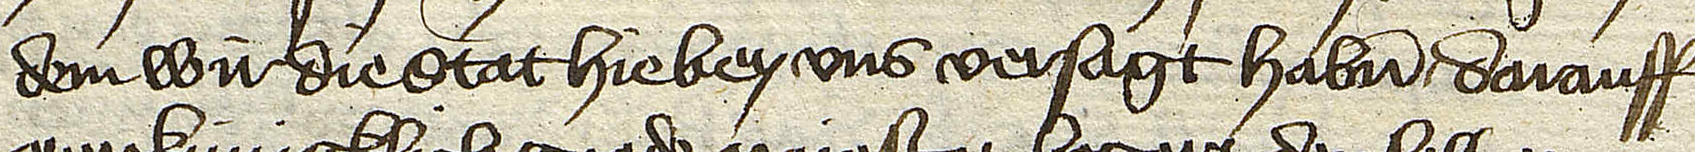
dem wir die Stat hie bey vns verſagt hab*n / darauff
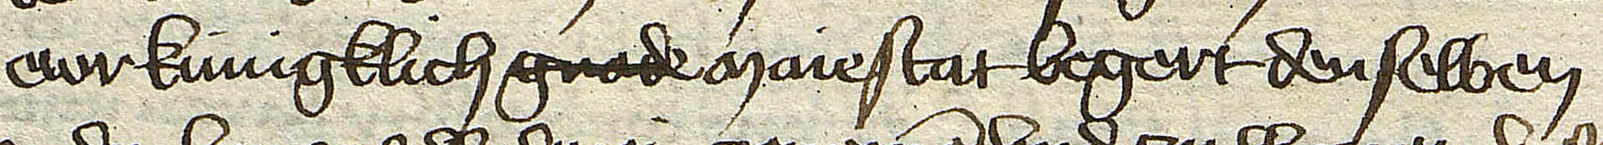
ewr künigklich gnade Maieſtat begert denſelben
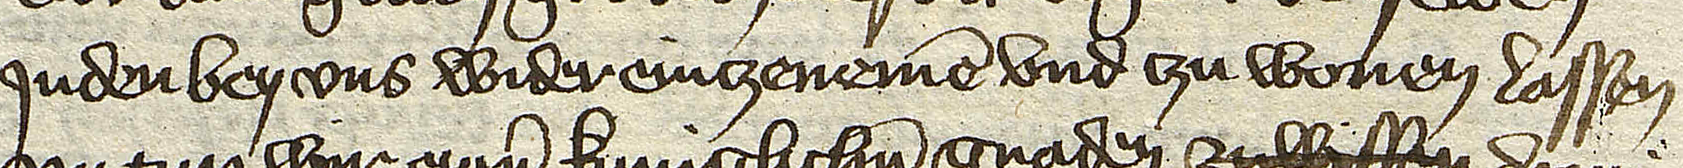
Iuden bey vns wider eincʒeneme* vnd cʒu wonen laſſen
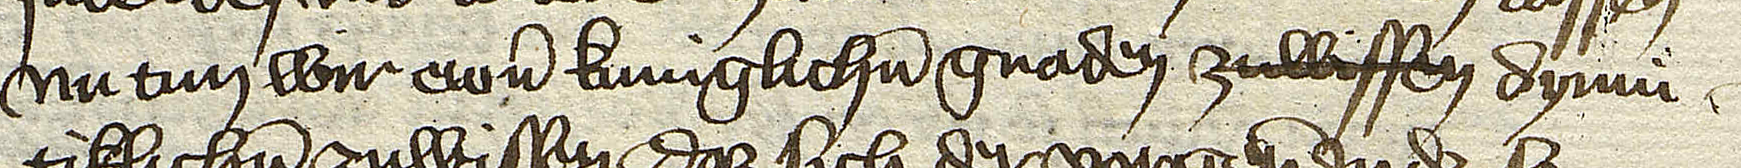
Nu tun wir ew*n kuniglich*n gnaden cʒuwiſſen dymü -
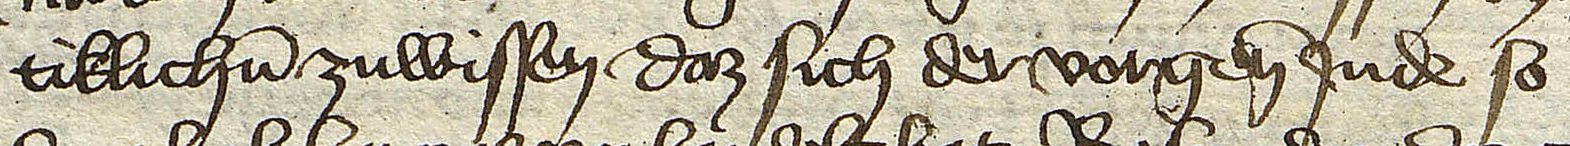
tiklich*n cʒuwiſſen / daʒ ſich der vorgen* Iude ſo
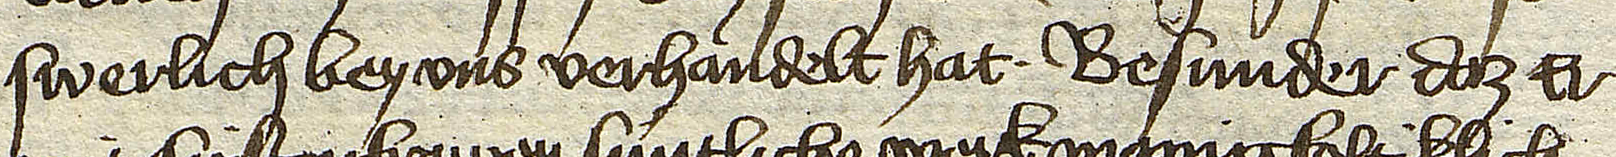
ſwerlich bey vns verhandelt hat . Beſunder daʒ Er
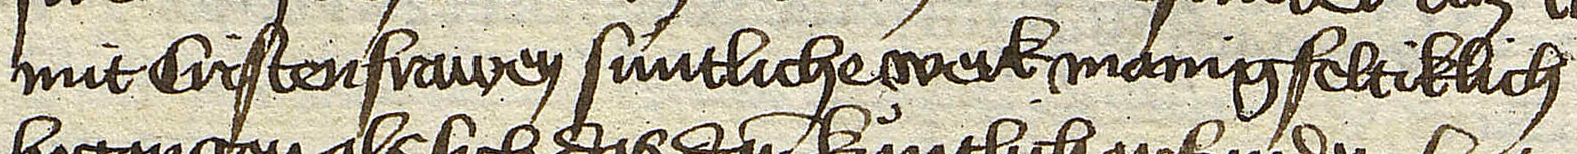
mit Criſtenfrawen ſüntliche werk manigfeltiklich
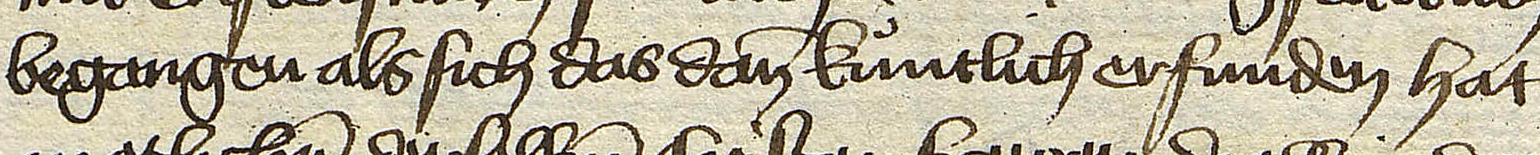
begangen als ſich das dan* küntlich erfunden hat
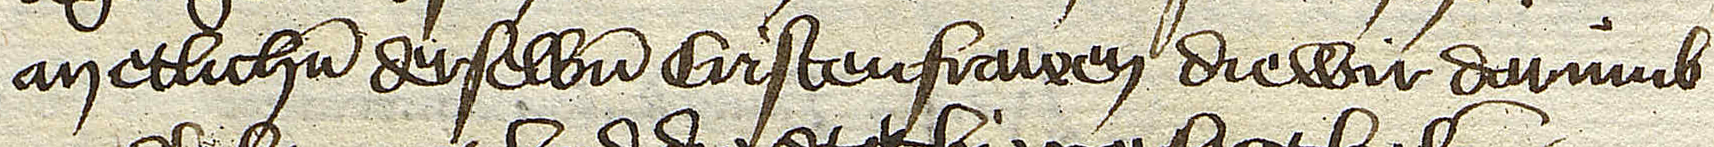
an etlich*n derſelb*n Criſtenfrawen die wir darümb
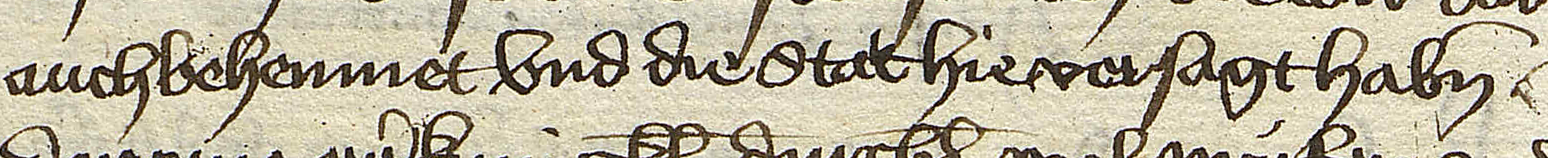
auch behemnet vnd die Stat hie verſagt hab*n /
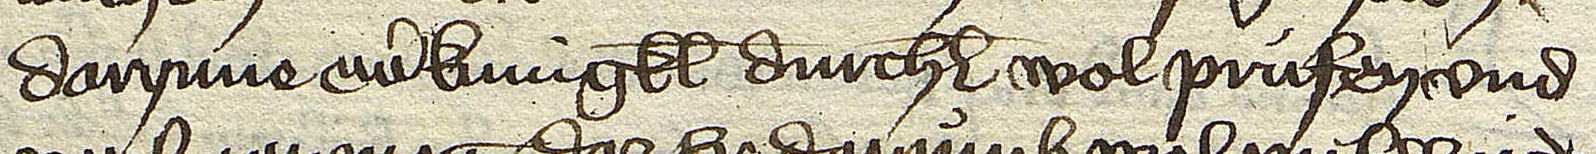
darynne ew* kunigkl* durchl* wol prüfen vnd
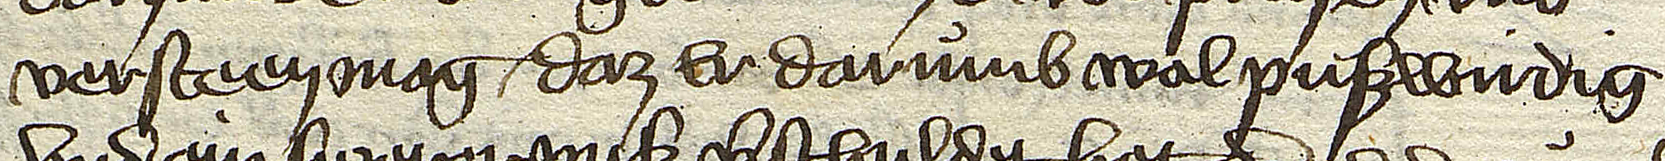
verſteen mag / daʒ Er darümb wol puſʒwirdig
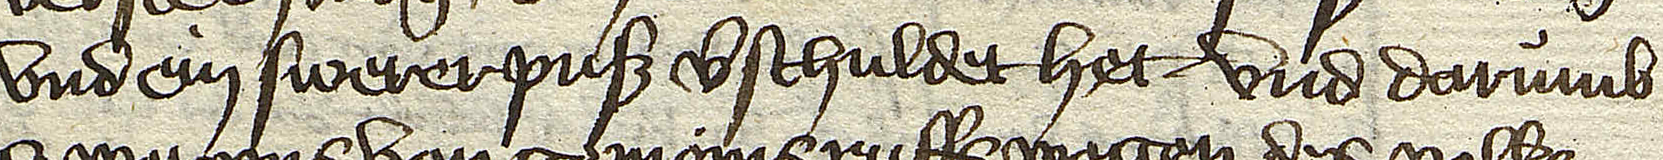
vnd ein ſwerer puſʒ v*ſchuldet het / Vnd darümb
